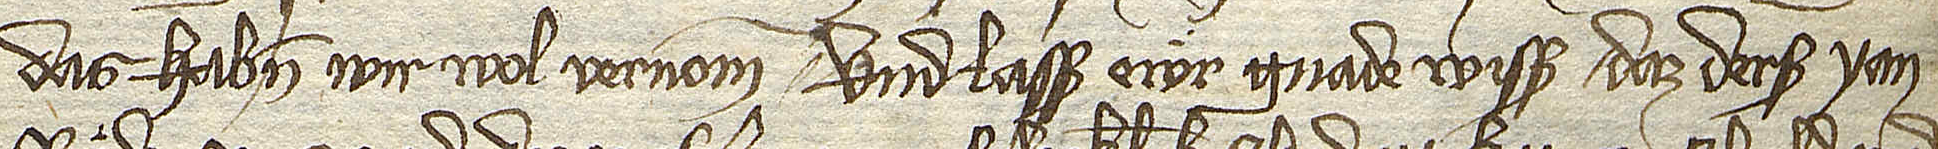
Das habn* wir wol vernom* / Vnd laſſ* eẅr gnade wiſſ* / daʒ derſ* Yan
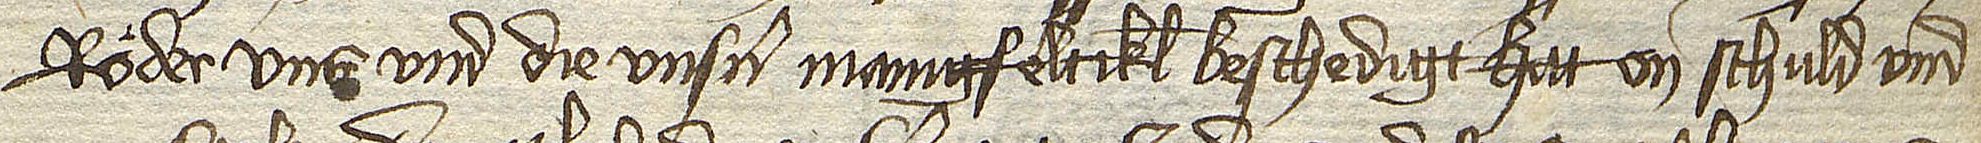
Röder vns vnd die vnſn* manigfeltikl* beſchedigt hat on ſchuld vnd
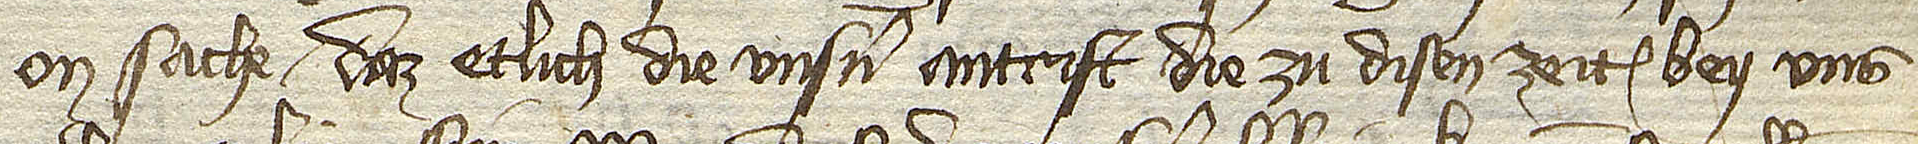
on ſache / Daʒ etlich die vnſn* antrift / die ʒu diſen ʒeit* bey vns
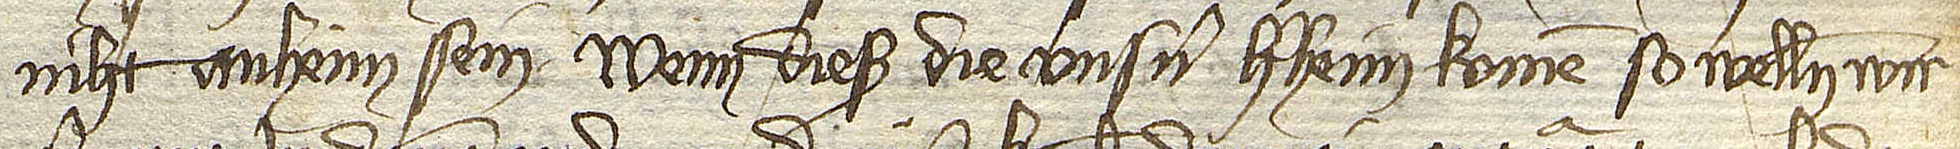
niht anheim ſein / Wenn dieſ* die vnſn* h*heim kome* ſo welln* wir
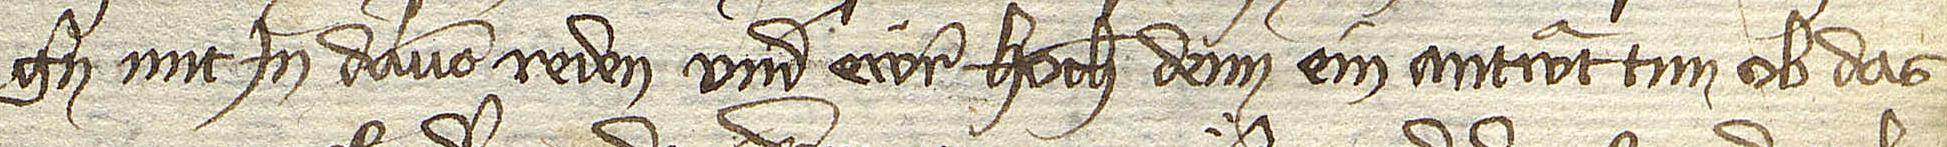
g*n mit In dauo* reden vnd eẅr* hoch* denn ein antw*t tun ob das
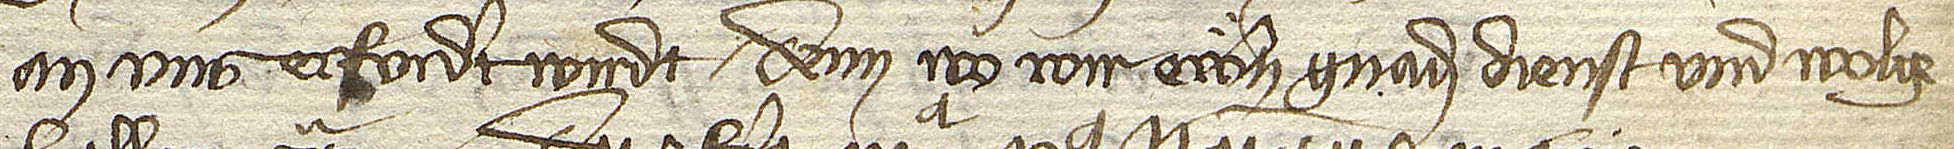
an vns erford*t wirdt / Denn wo wir eẅ*n gnad* dienſt vnd wolge
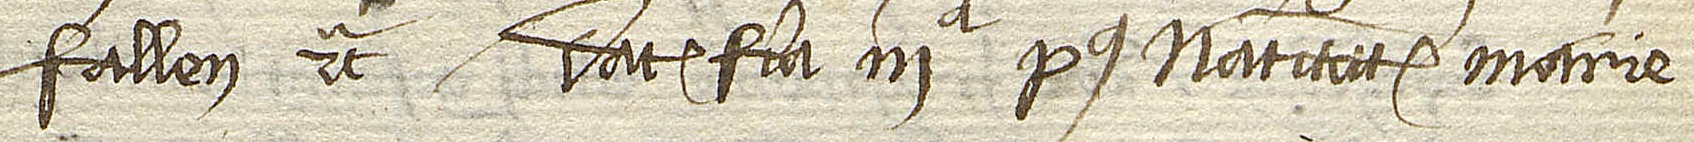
fallen ec* / Dat* fi*a iii* p* Natitat* marie
